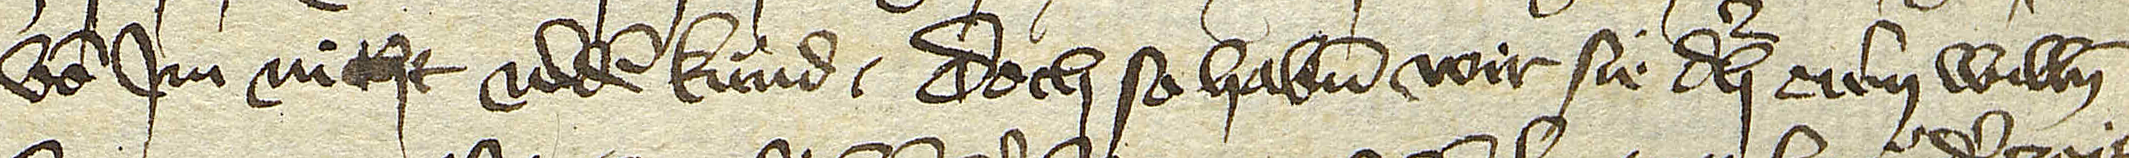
vo* Im nicht w*d* künd / Doch ſo habn* wir ſie d*h ew*n willn*
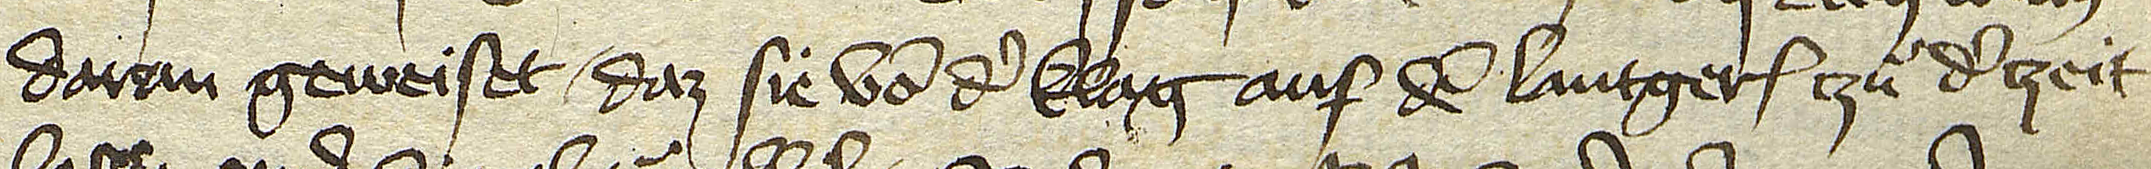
daran geweiſet / daʒ ſie vo* d* klag auf d* lantger* cʒü d* cʒeit
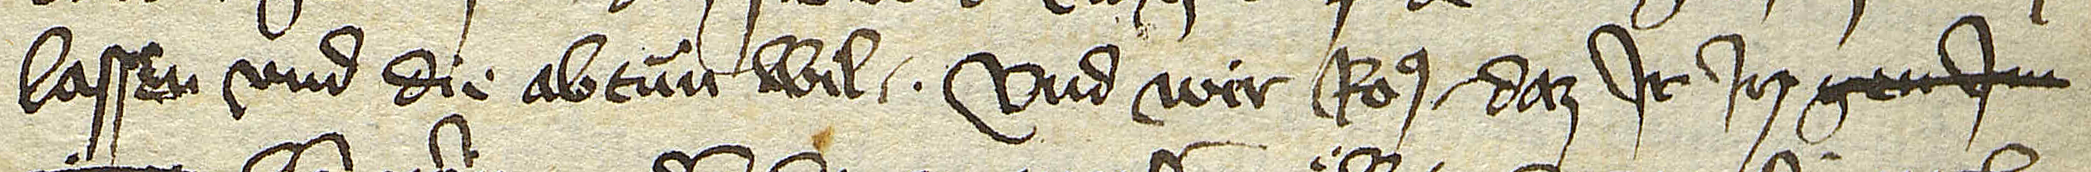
laſſen vnd die abtün wil / . vnd wir Ro* / daʒ Ir In gen Im
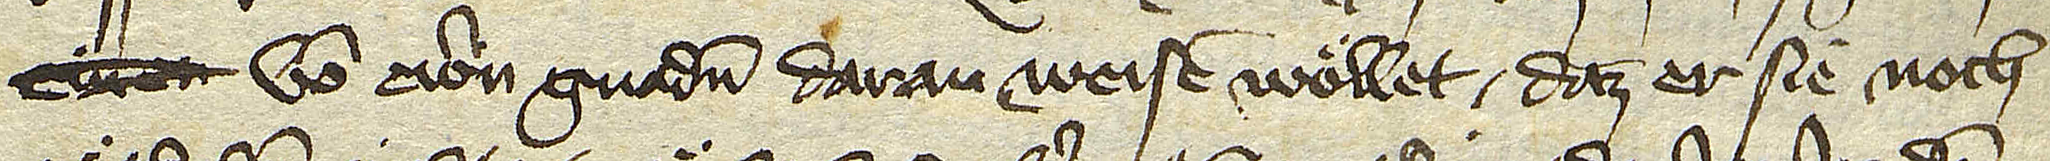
einen vo*ew*n gnadn* daran weiſe* wöllet / daʒ er ſie noch
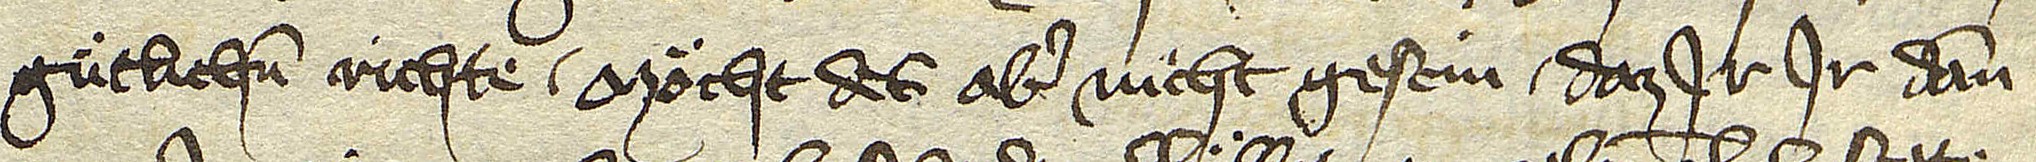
gütlichn* richte / Möcht des ab* nicht geſein / daʒ Ir Ir dan*
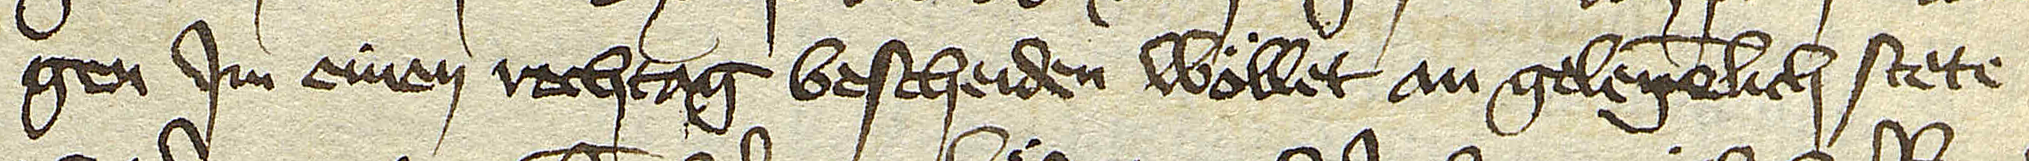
gen In einen rechtag beſcheiden wöllet an gelegelich* ſtete
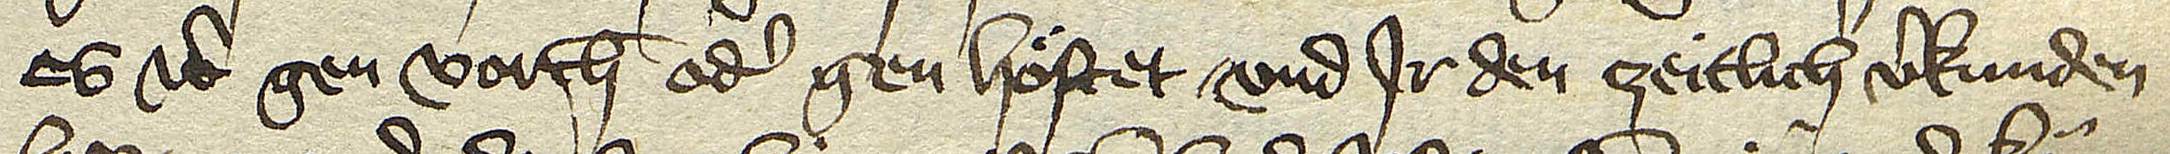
es vo* gen vorch* od* gen höſtet / vnd Ir den cʒeitlich v*kunden
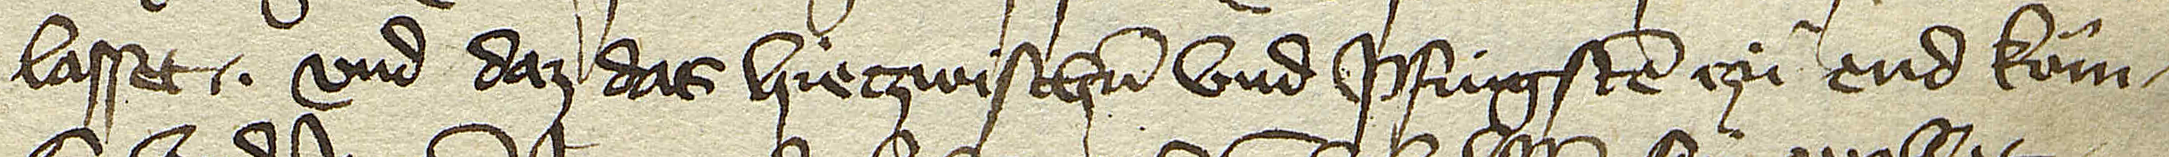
laſſet / . vnd daʒ das hiecʒwiſchn* vnd Pfingſte* cʒü end köm /
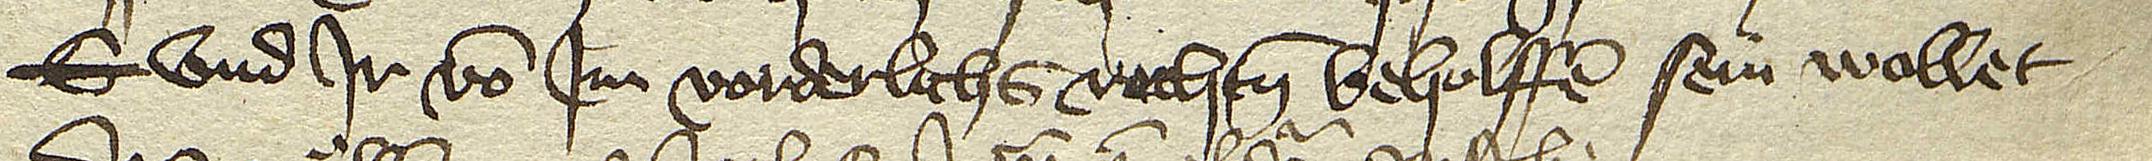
E vnd Ir vo* Im vorderlichs rechtn* beholffe* ſein wollet /
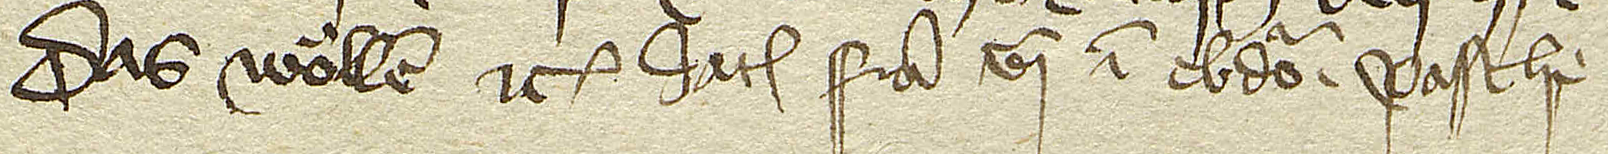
Das wölle* ec* dat* fia* vi* i* ebdo*. Paſche
